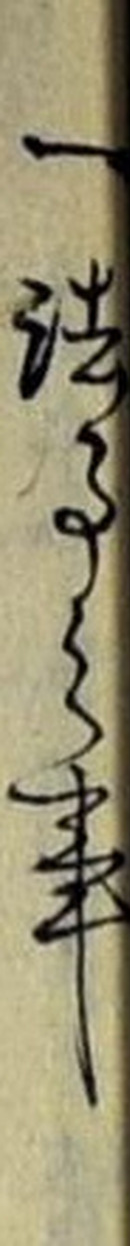一法事之事
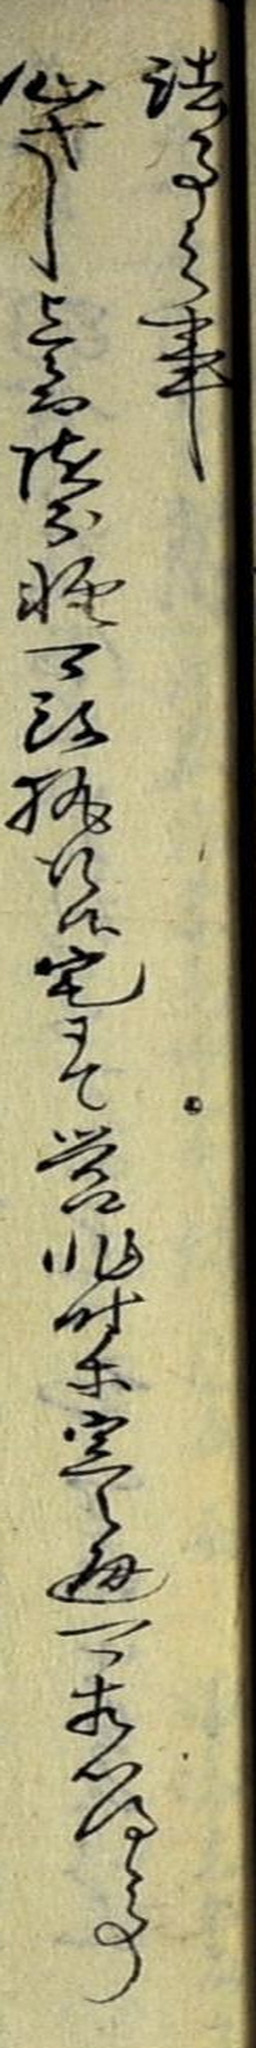心さし迄ニ而随分軽可致執行候宅にて営非時等定之通可相心得候事
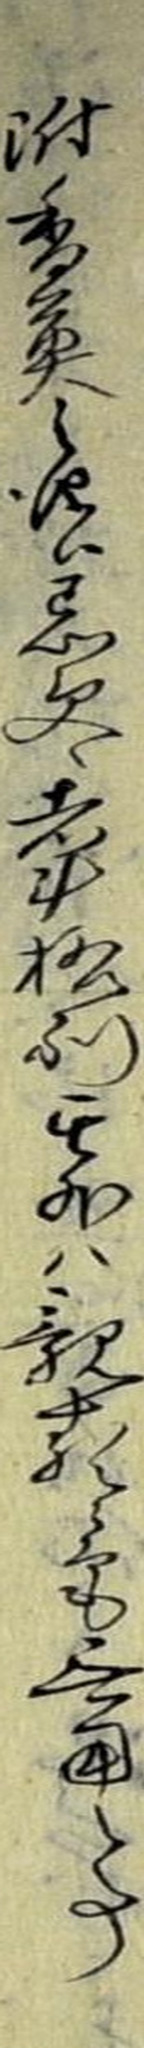附香奠之儀ハ忌受候者斗格別其外ハ親類ニ而も無用之事
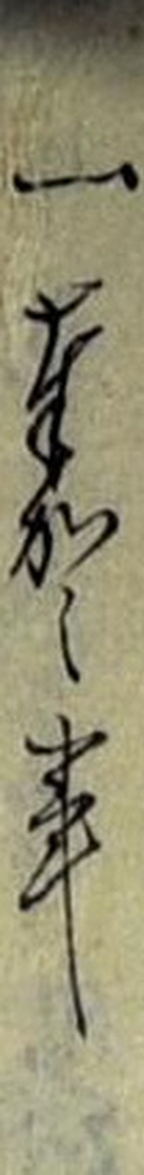一奉加之事
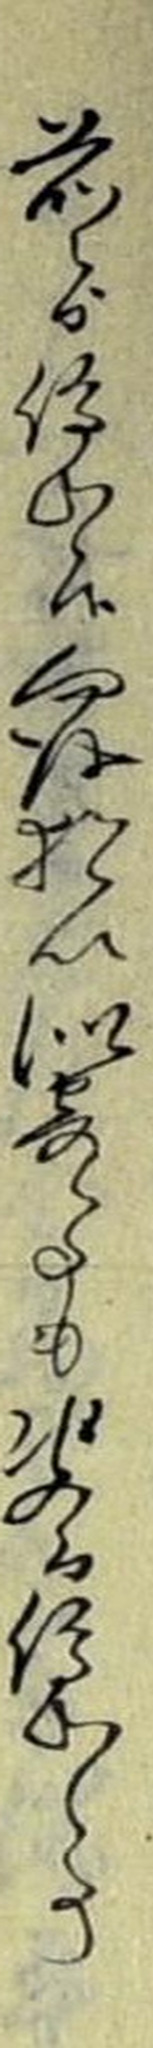前々ゟ停止ニ候向後猶以似寄候事も決而停止之事
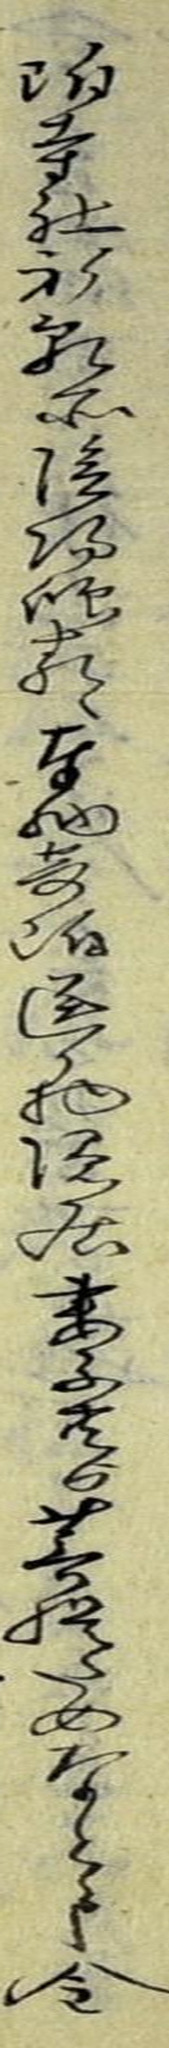附寺社祈願所陰陽師類へ奉納寄附送り物隠居妻子共ゟ菩提ためなとと申金
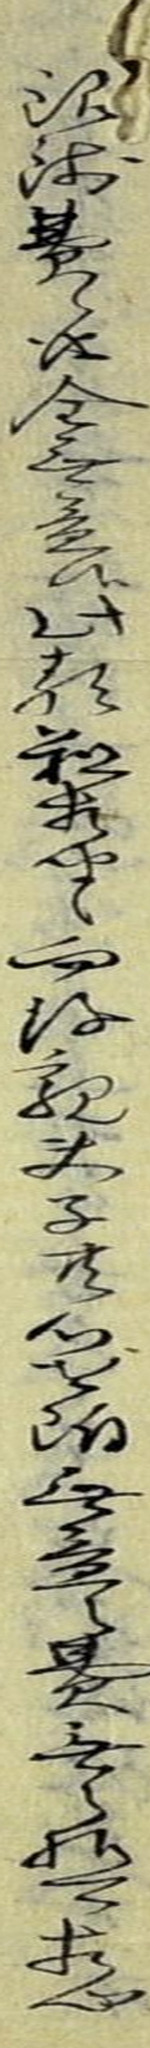銀銭費之儀全無益候此類粗相聞候向後親夫子共心を付無益之費無之様可相心
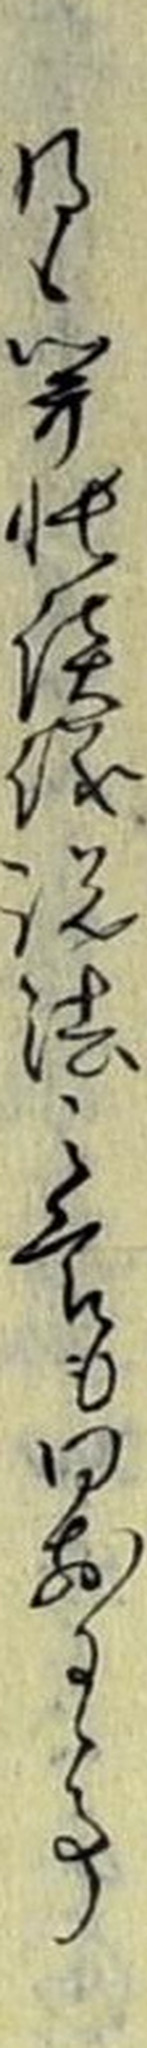得候開帳談議説法之節も同前に候事
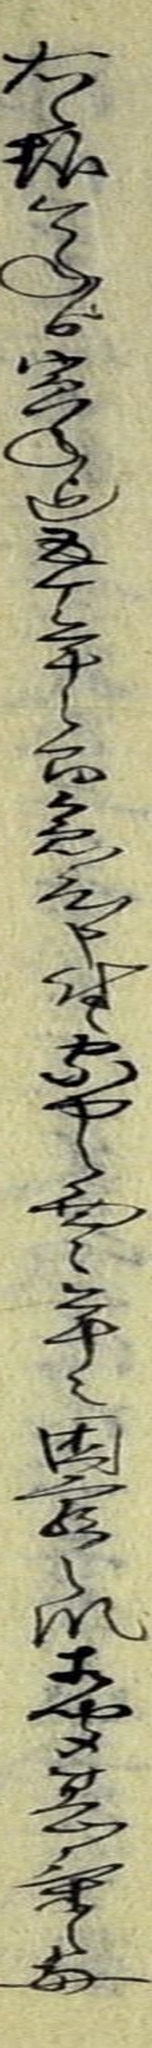右之趣今年ゟ寅年迄五ケ年之間急度申付候家中之面々年々困窮之段相聞甚気之毒
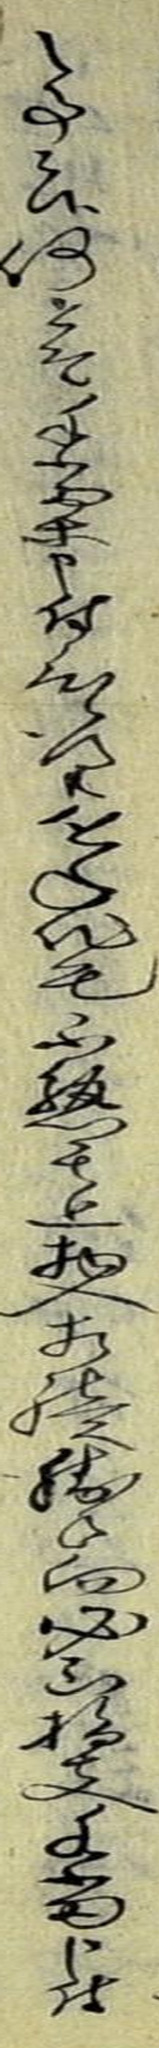之事ニ候何とそ手当等申付度候得共近年作毛不熟其上物入相続勝手向必至指支手当申付
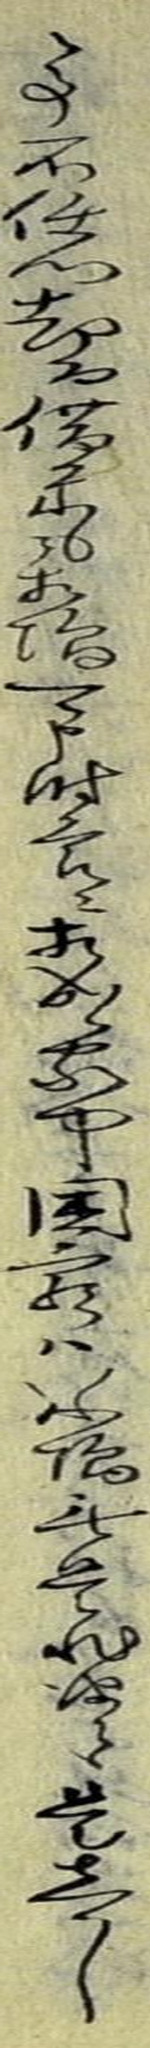候事不任心却而借米も相増可申時節ニ相成候家中困窮ハ弥増無是非儀ニ候是しかし
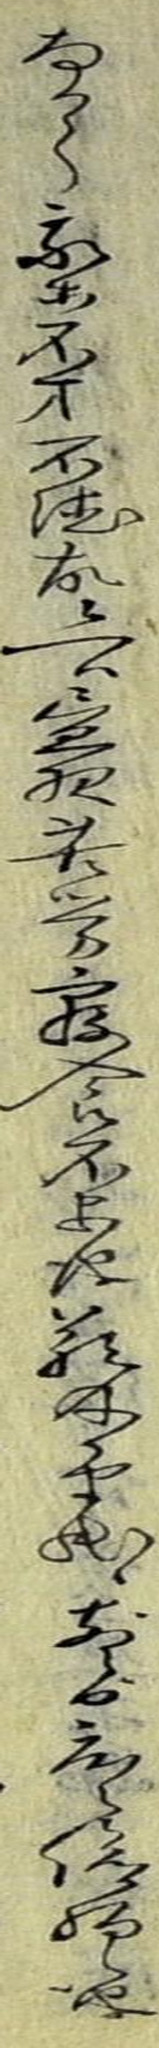なから我等不才不徳故候ヘハ昼夜苦労寝食不安儀難及筆紙候前々ゟ度々倹約之儀
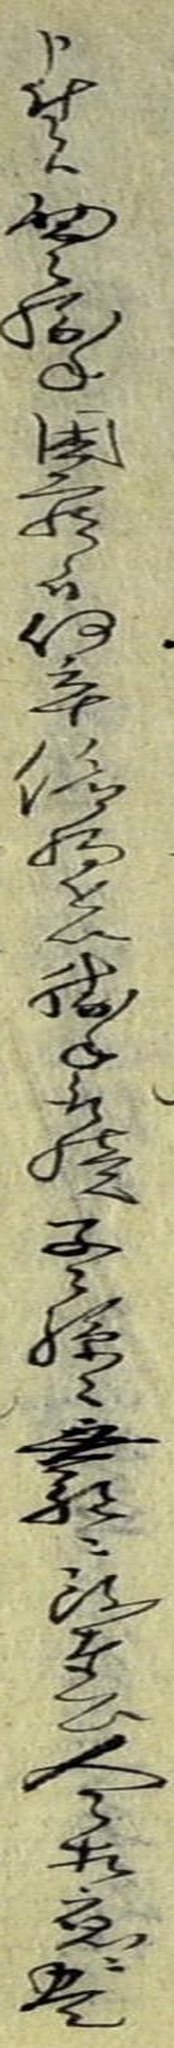申付候ハ面々勝手困窮ニ付何卒倹約を以勝手取続子々孫々無難ニ致奉公人々相応ニ
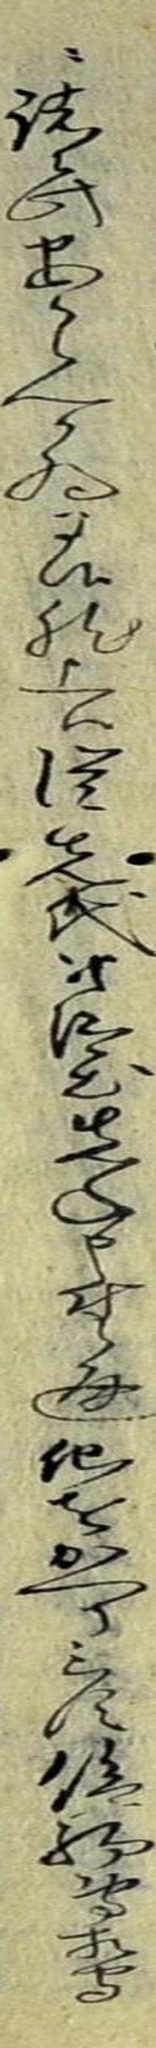ニ諸々此安からんか為に候然上ハ従先代被仰出先年申付候通他をかへりみす倹約専相守
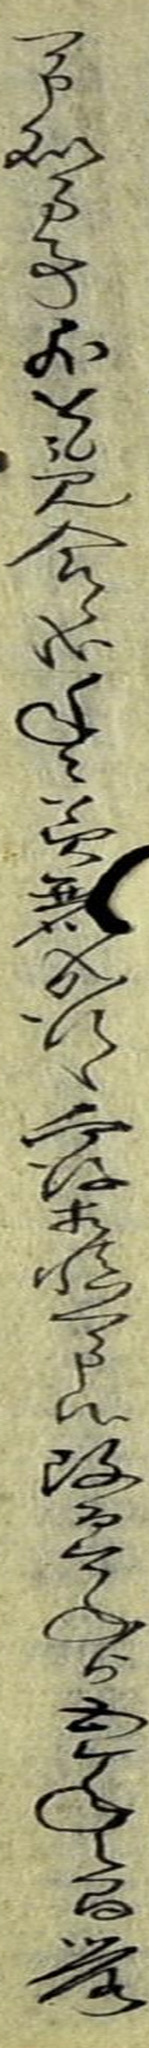可申処万事外をも見合候哉年々美麗成行候向後相慎可申候改而今年ゟ五ケ年之間厳
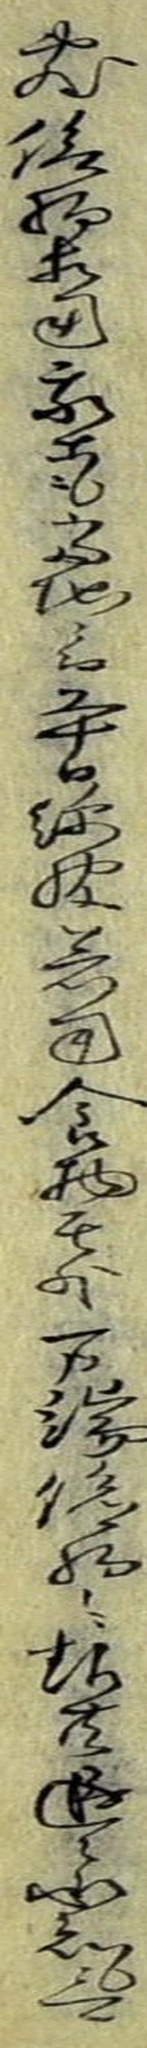敷倹約相用我等も当地ニ而平日綿服着用食物其外万端倹約之趣共追々承知も可
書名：命令之部 一
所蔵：福井県文書館 Fukui Prefectural Archives
